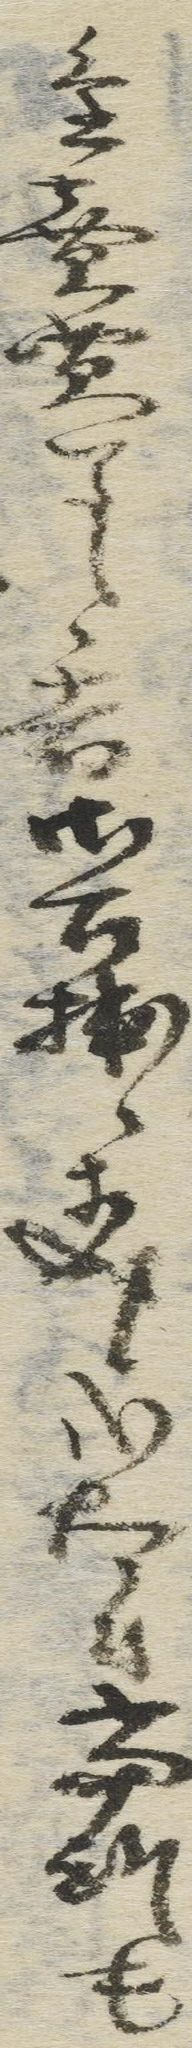金売買いたし候者御召捕二相成候哉右二付当所も
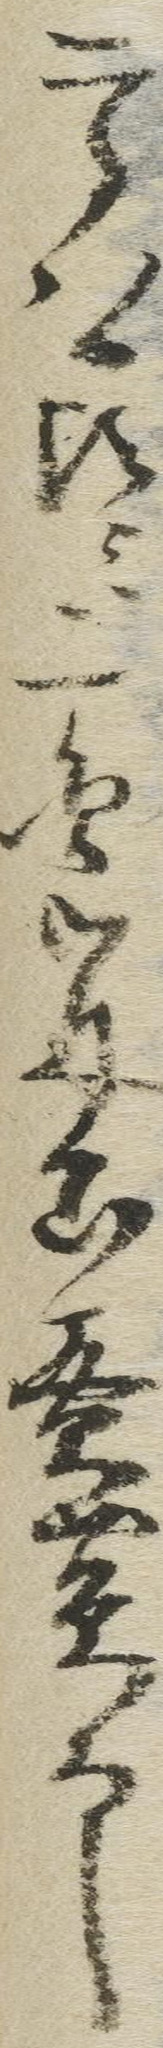二月八日頃二ハ一圓弐朱金売買なし
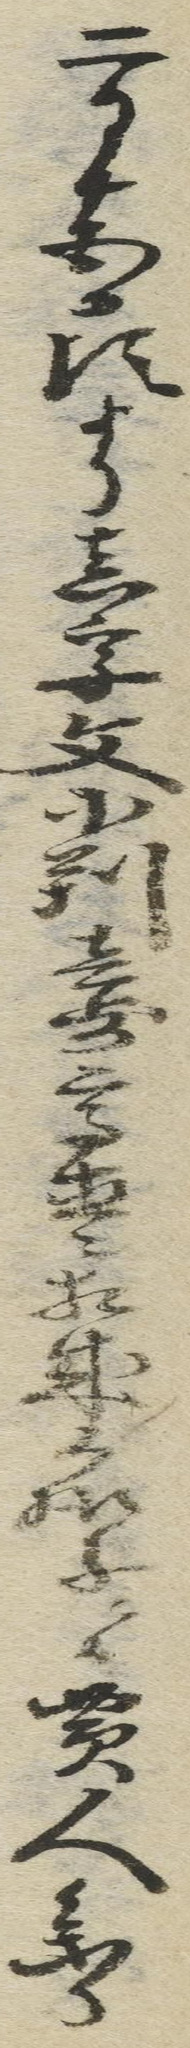二月十五日頃より真字文小判壱歩高直二相成候様子二而買人参り
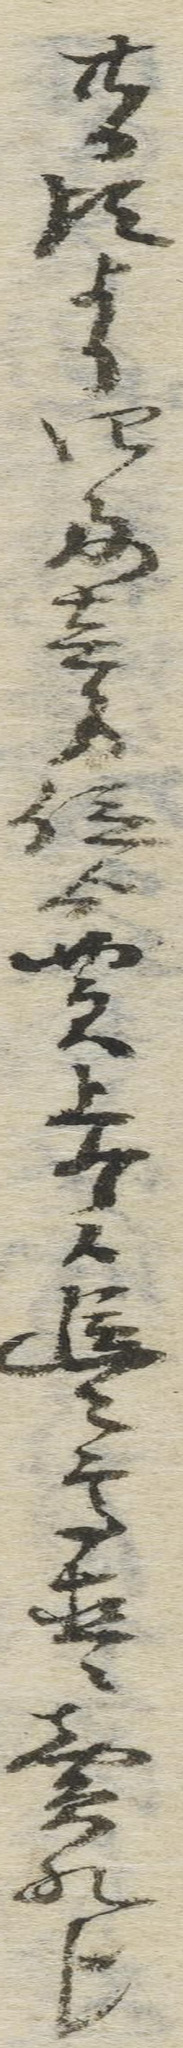廿日頃より四両壱分位ゟ買上ヶ候追々高直二売れ申候
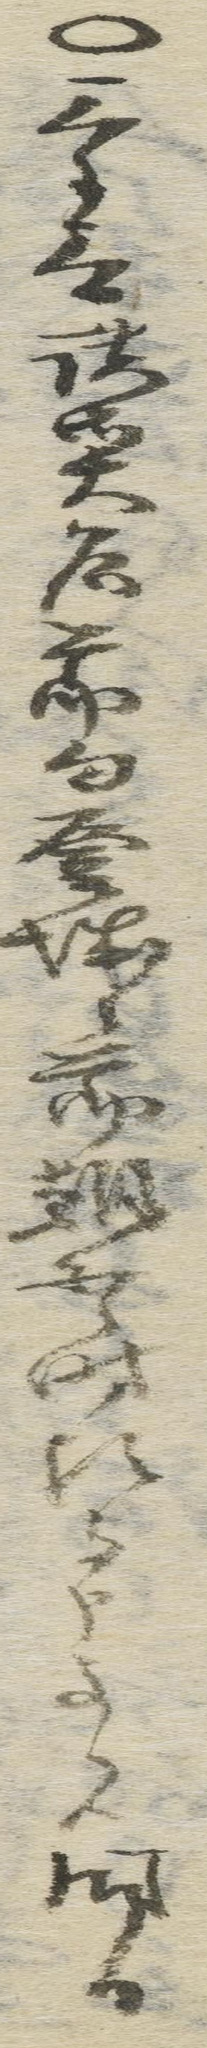○三月三日諸御大名節句登城之節朝五ッ時頃と申事二候同日
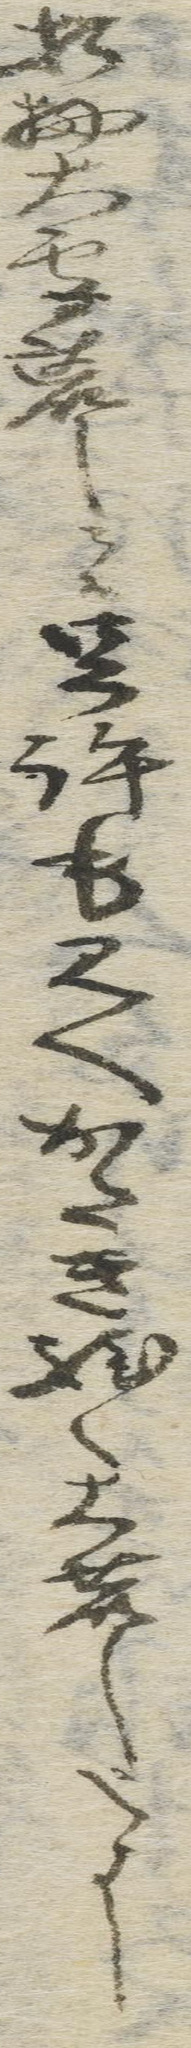折柄大雪荒し二而足許も見へかたき程之大荒し也よし
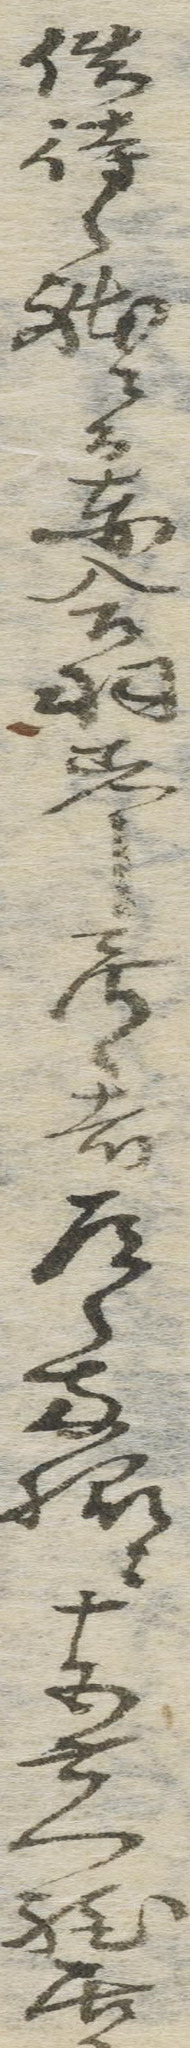供侍之躰二而赤合羽着し居候者道之両脇二十五六人程居候
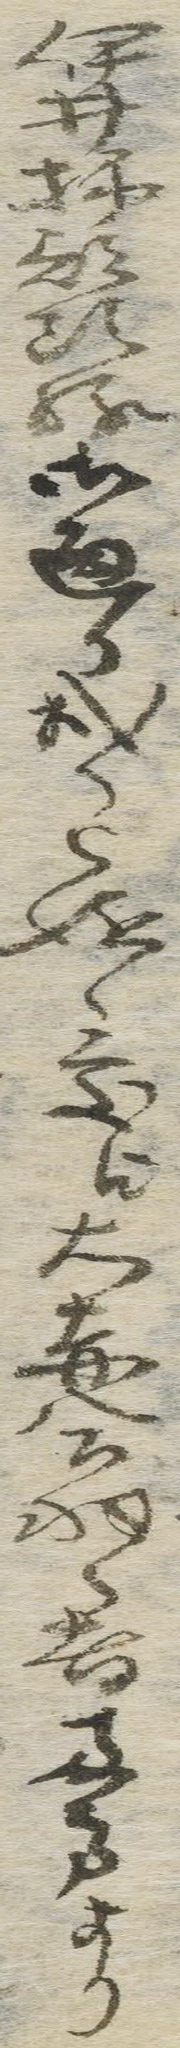井伊掃部頭様御通り成被遊候処江右赤合羽之者両方より
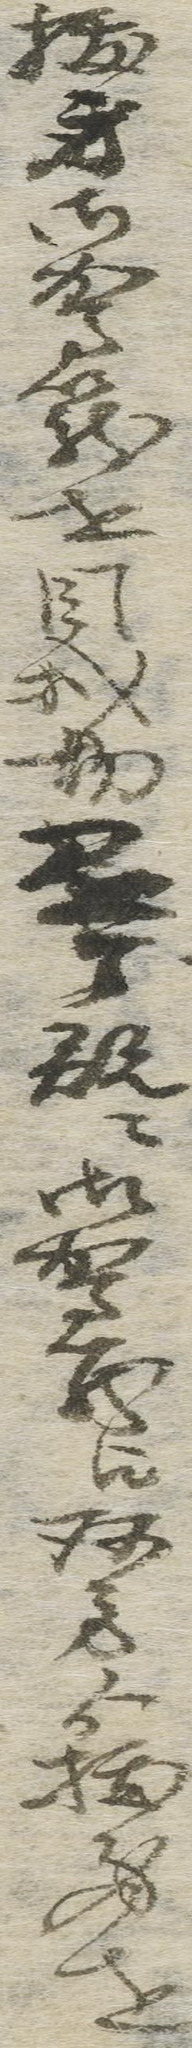抜身御駕籠を目掛切懸ヶ既二御駕籠江双方ゟ抜身を
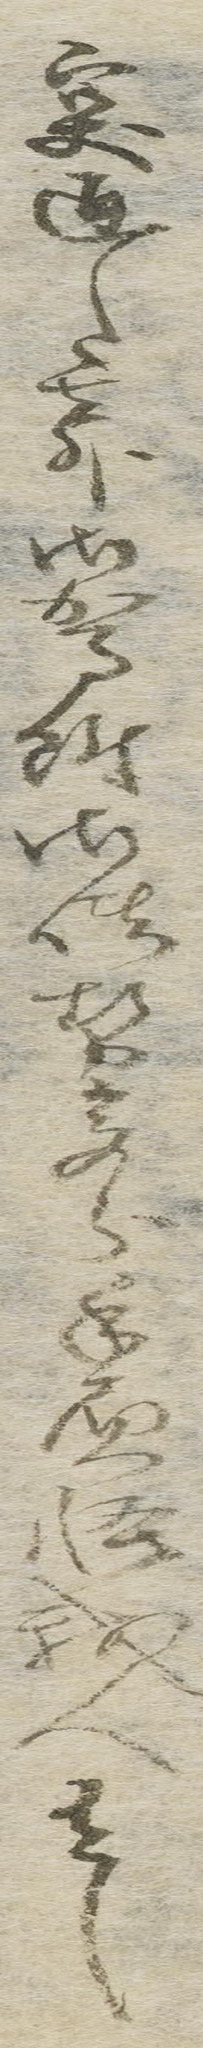突通した其外御駕附御供勢多分手負怪我人有之
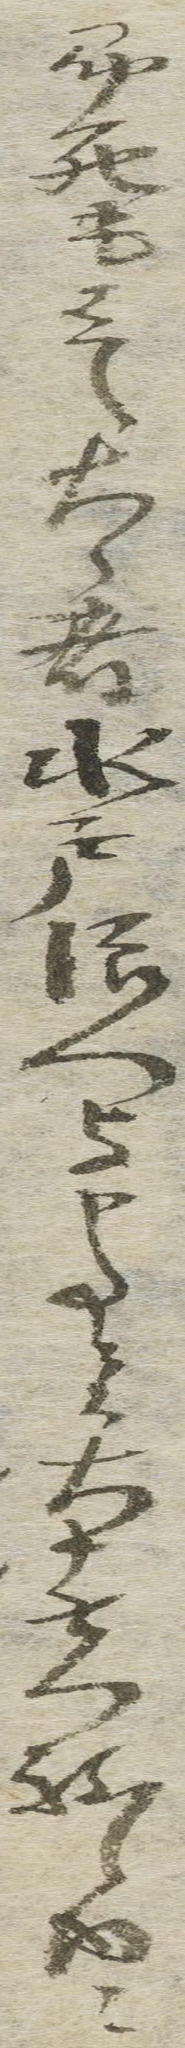即死も有之右之者水戸浪人と申事二而右十六人程之内二
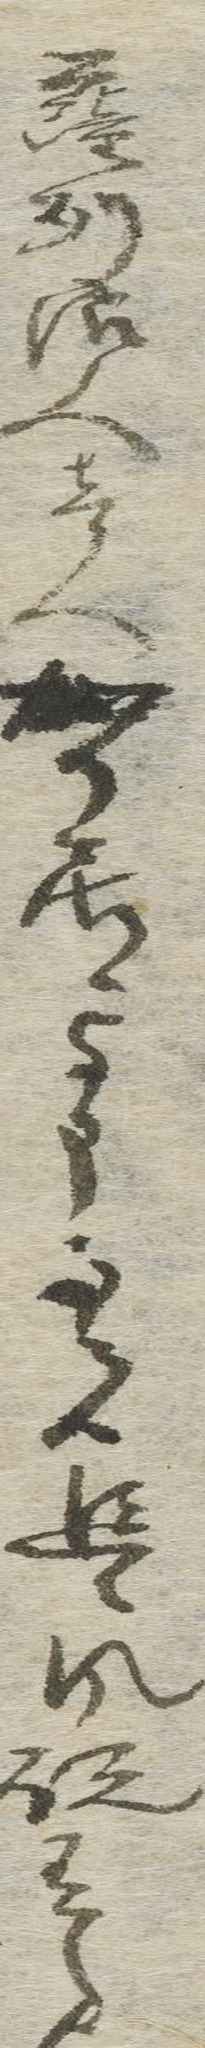薩州浪人壱人加り居候と申事二候追々風聞有之候
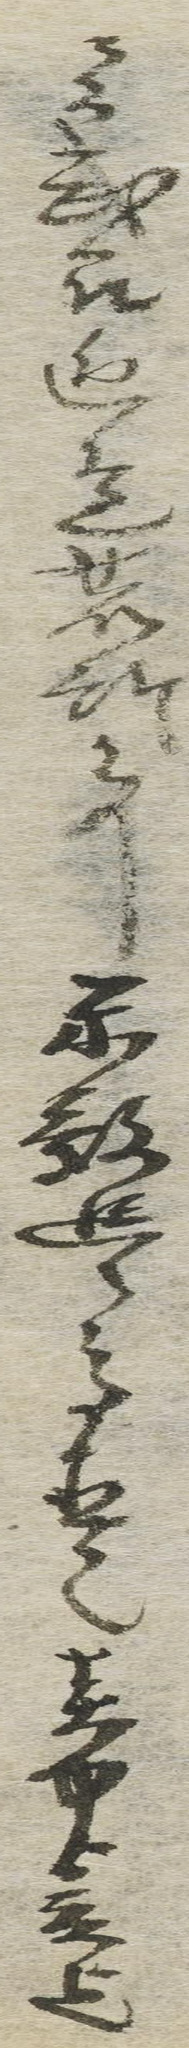二而武州辺迄荒所多し米穀追々高直也春中ゟ夏迄
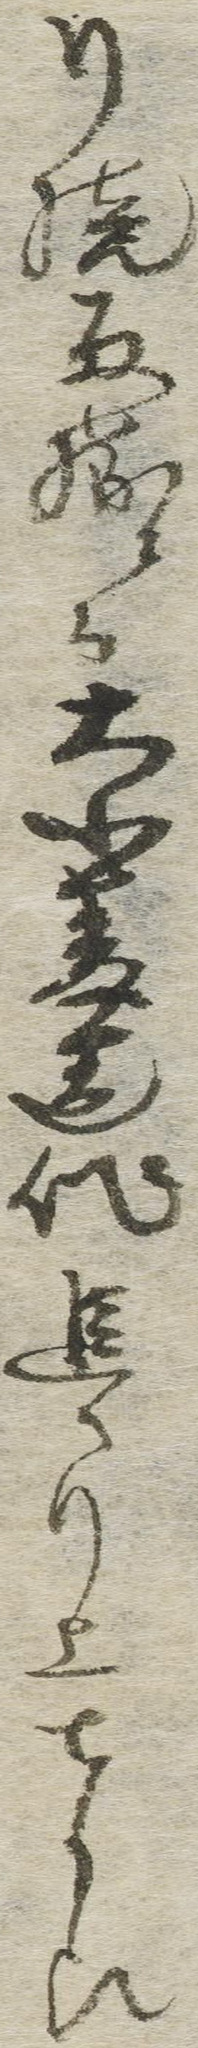引続雨降二而大小麦違作追々引上七月頃
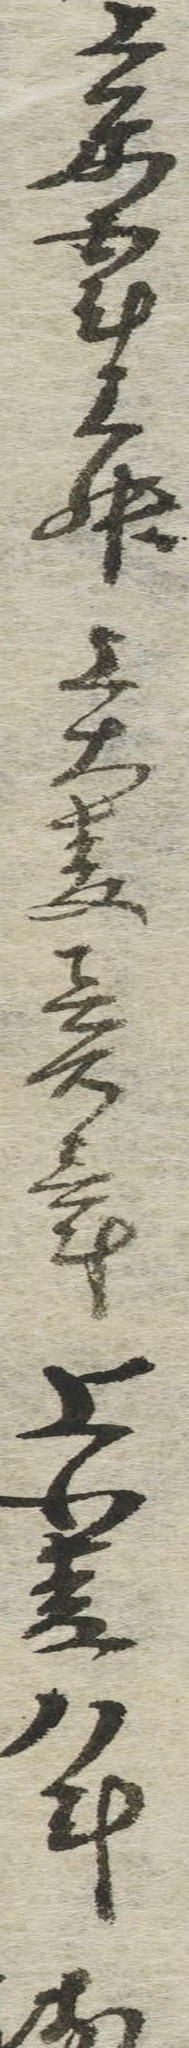上米五斗三升上大麦壱石壱斗上小麦八斗
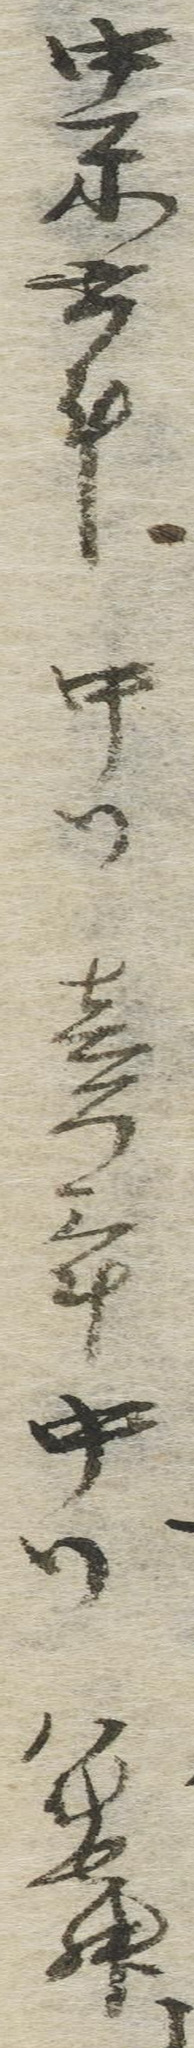中米六斗中同壱石三斗中同八斗七升
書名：信濃越後　地震書留
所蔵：東京大学地震研究所図書室 Earthquake Research Institute Library, The University of Tokyo, JAPAN
